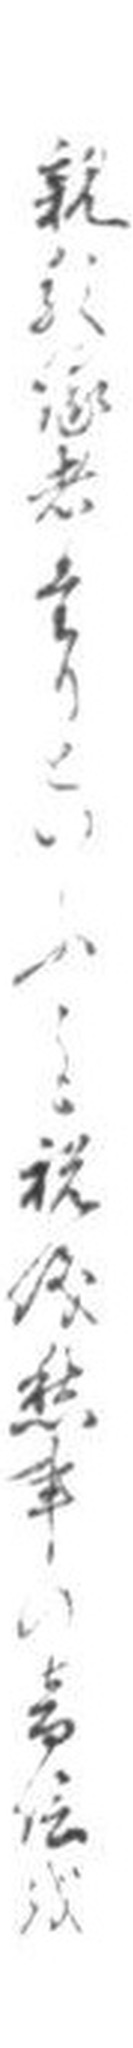親類縁者たりといふとも祝儀愁事の音信を
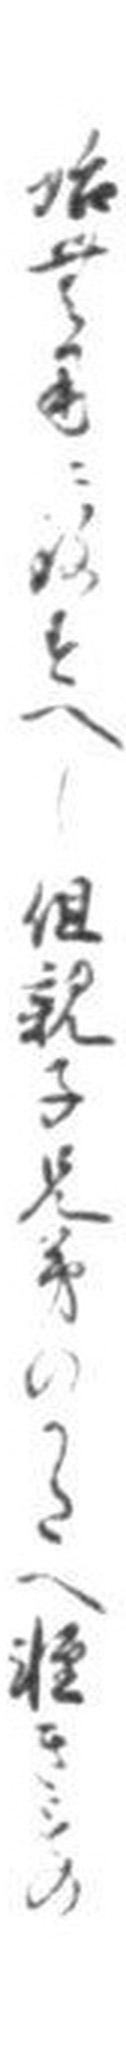始無用ニ致すへし但親子兄弟のかたへ軽きもの
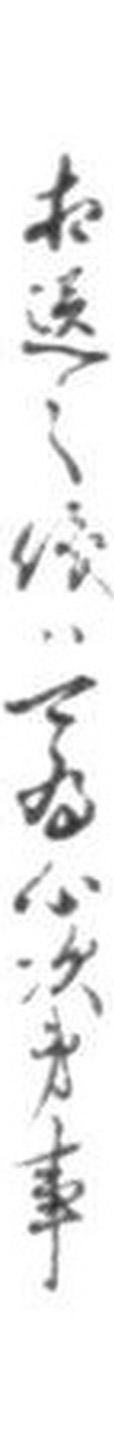相送之儀ハ可為心次第事
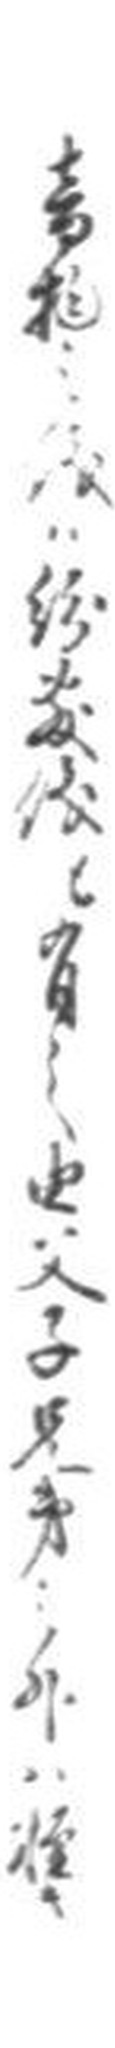音物之儀ハ紛敷儀も有之由父子兄弟之外ハ軽キ
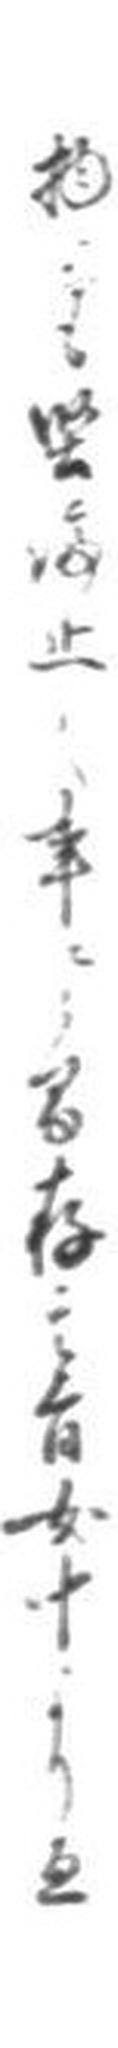物ニ而も堅停止之事ニ候間存其旨女中より互
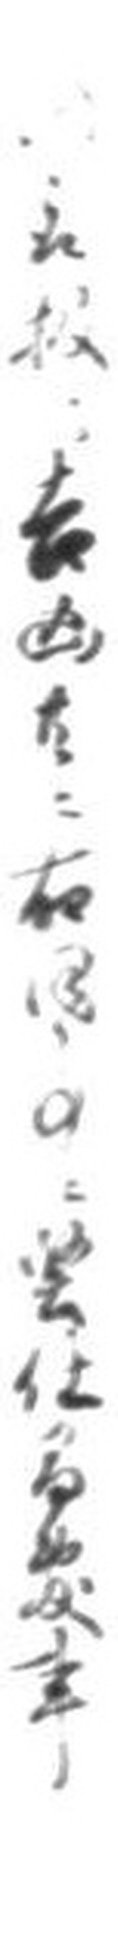の取扱も吉凶共ニ右同事ニ堅仕間敷事
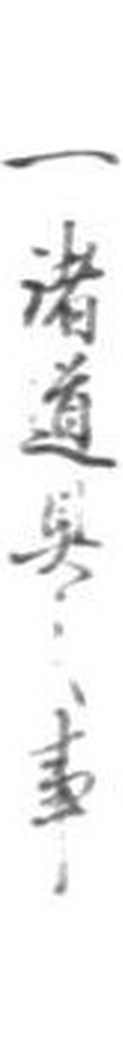一諸道具之事
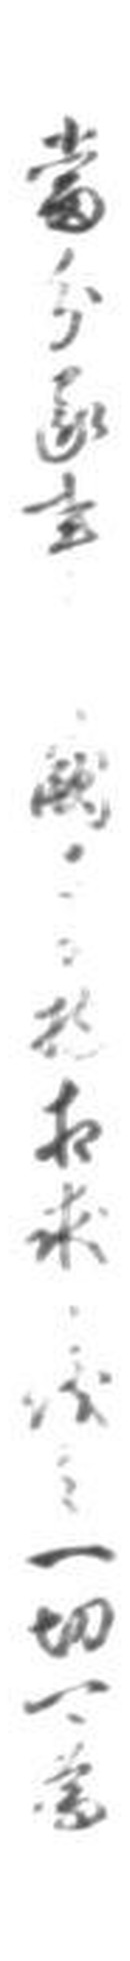当分家事闕さる物相求候儀者一切可為
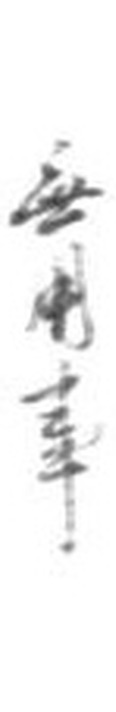無用事
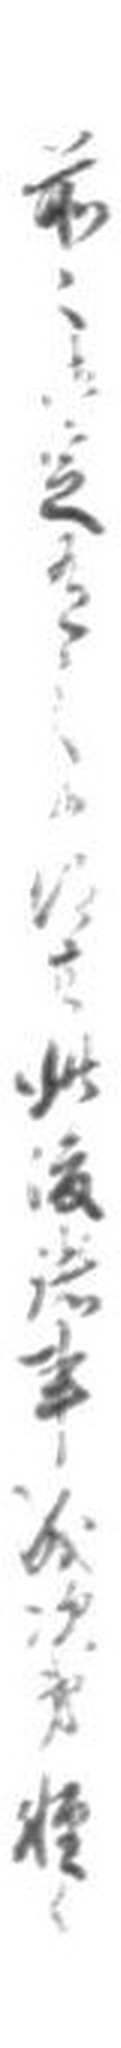前々御定有之候得共此後諸事成次第軽く
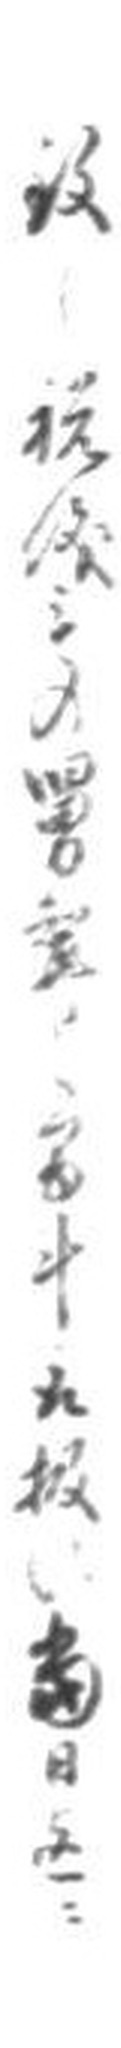致し祝儀もの舅聟之間斗取扱ひ当日迄ニ
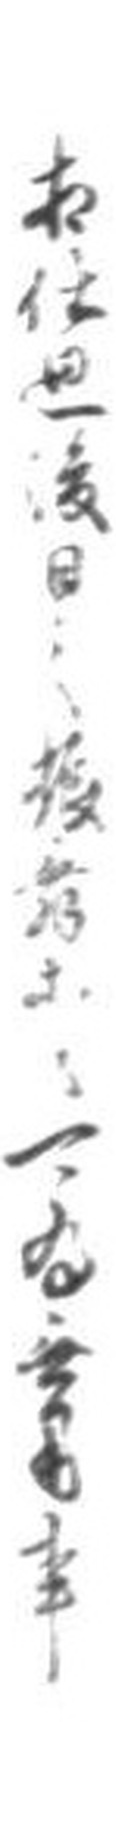相仕廻後日之振舞等者可為無用事

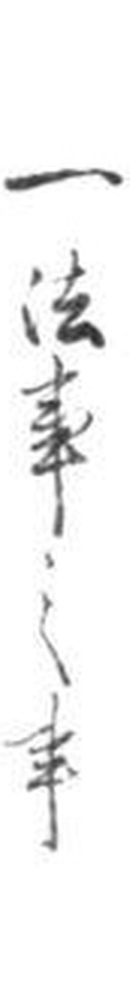一法事之事
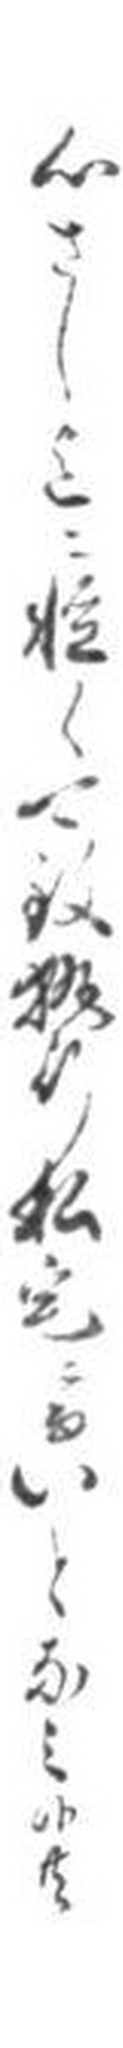心さし迄ニ軽く可致執行私宅ニ而いとなみ候共
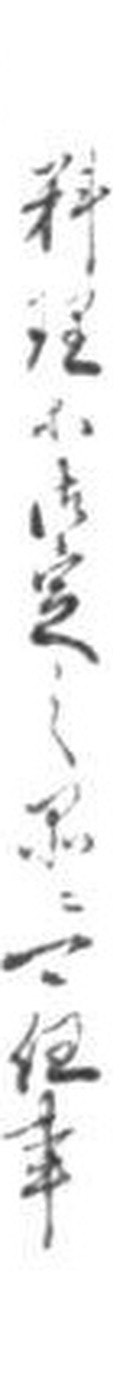料理等御定之品ニ可任事
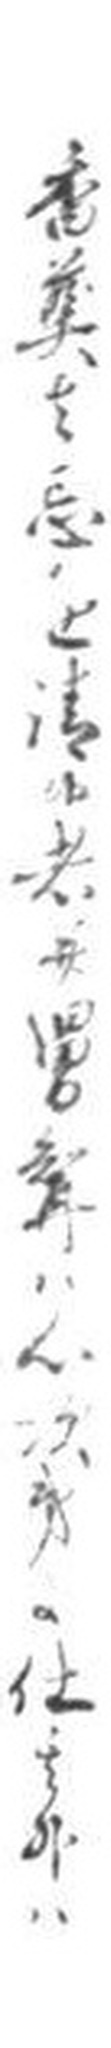香奠者忌を請候者并舅聟ハ心次第に仕其外ハ
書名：家譜 三十八 宗矩公 従享保九年五月到享保九年十二月
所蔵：福井県文書館 Fukui Prefectural Archives
